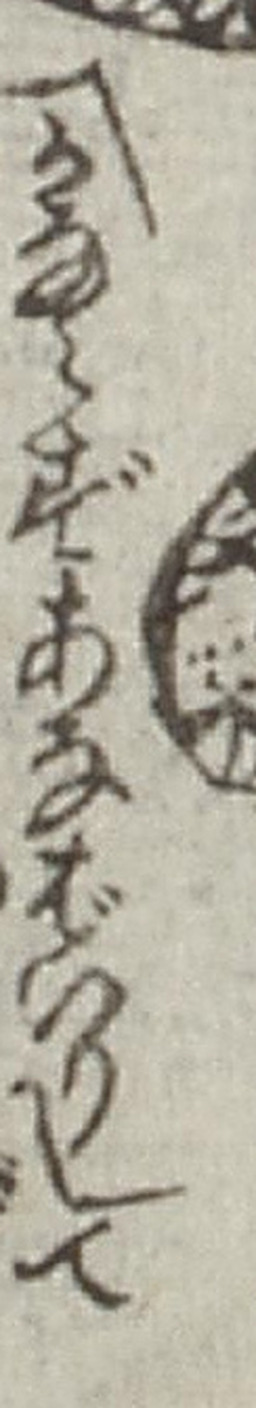〽かならずあなばいりして
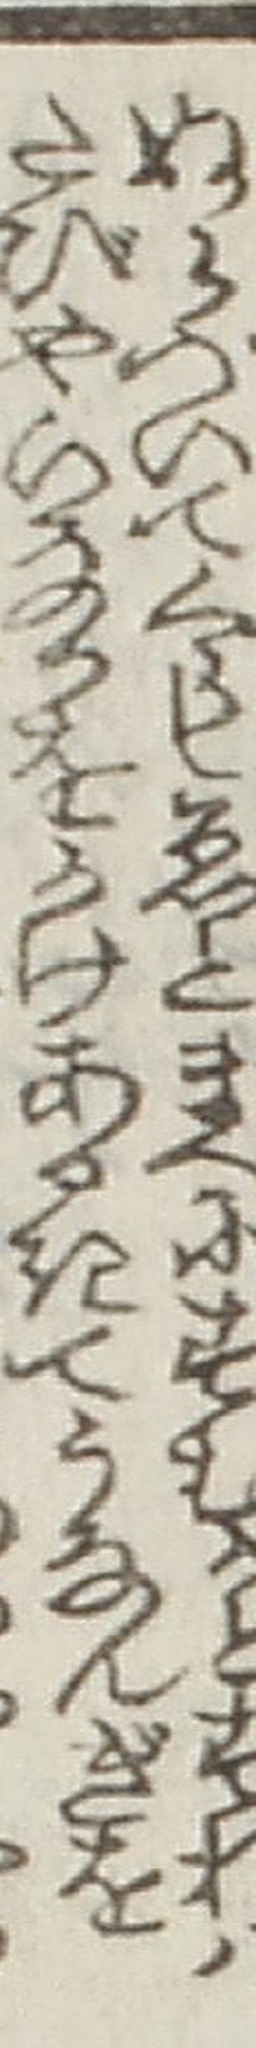たびやいろのかをかけあるきてうなんぎを
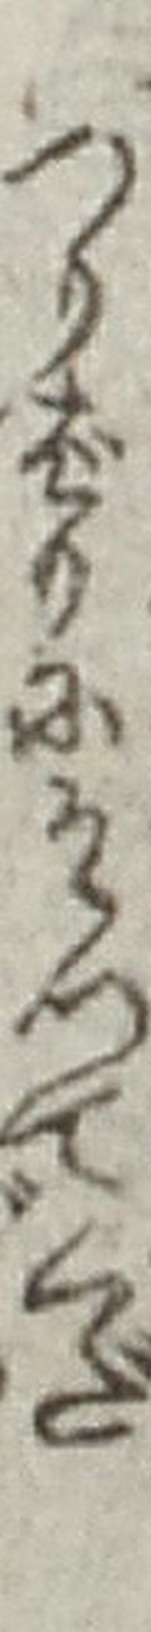つりばりにかゝつてくだ
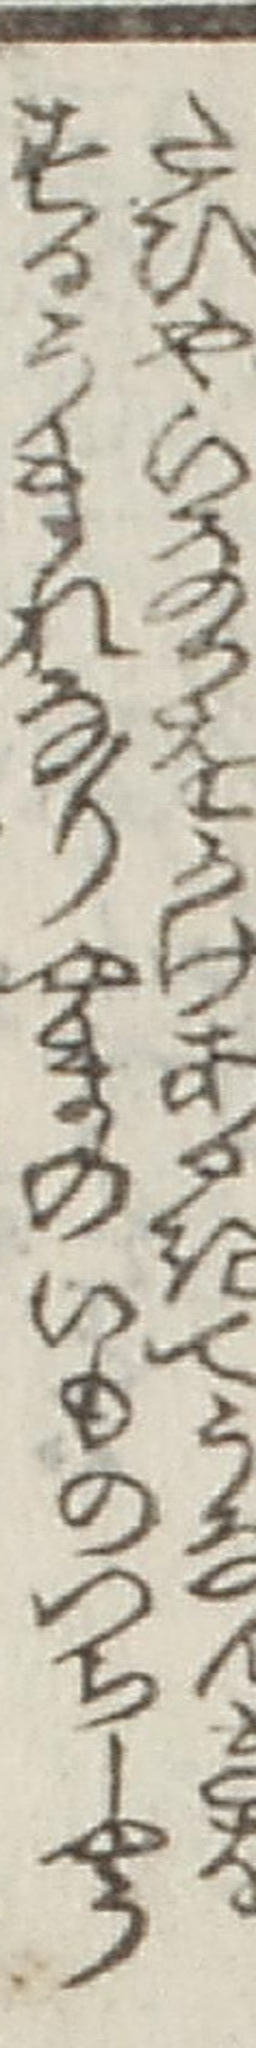するうまれなりやまのいものつちしやう
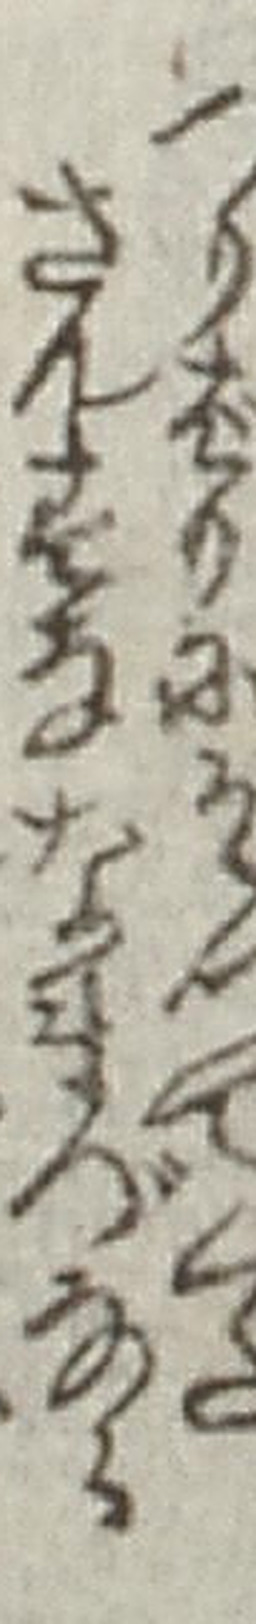さんすななまづなら
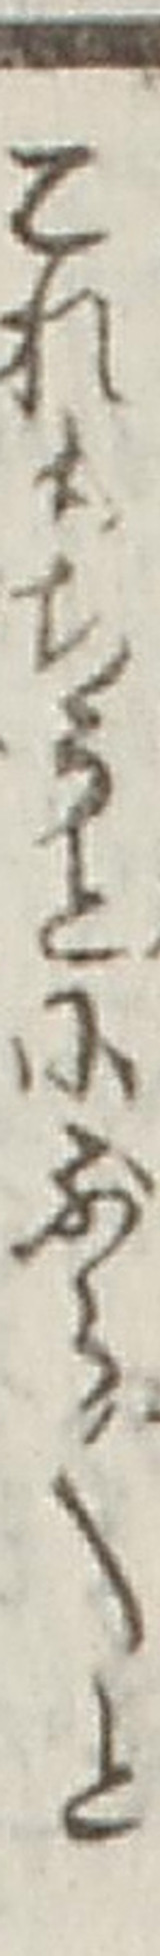これもちうとにぶら〳〵と
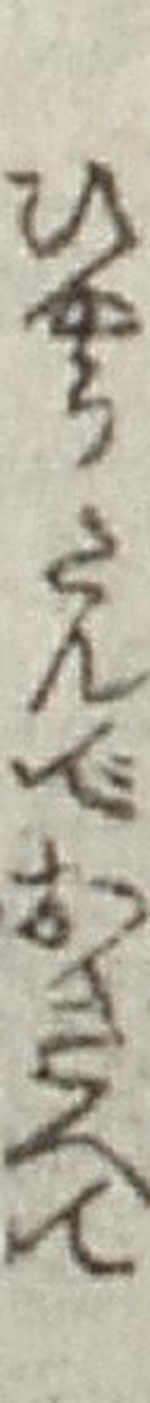ひやうたんでおさへて
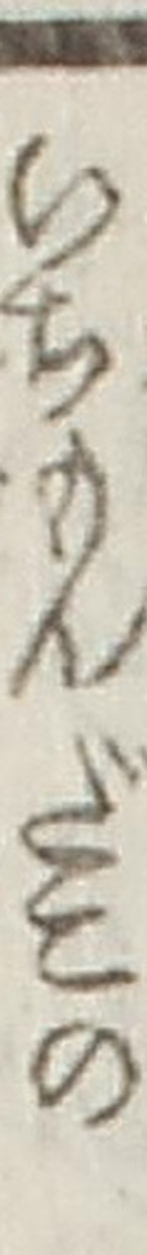いちもんだこの
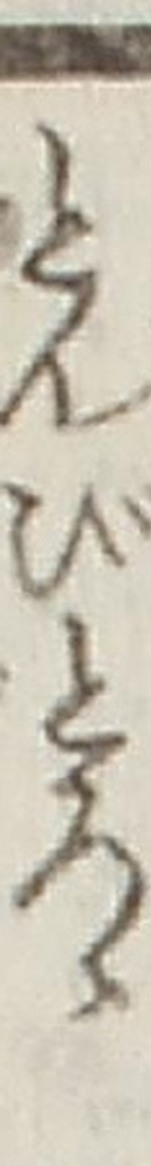とんびとろゝ
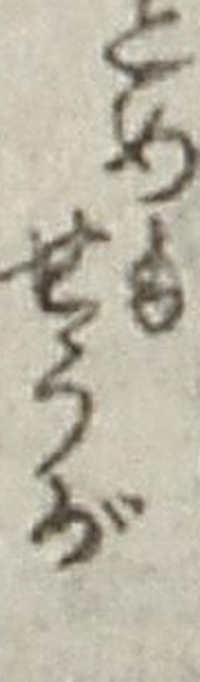せうが
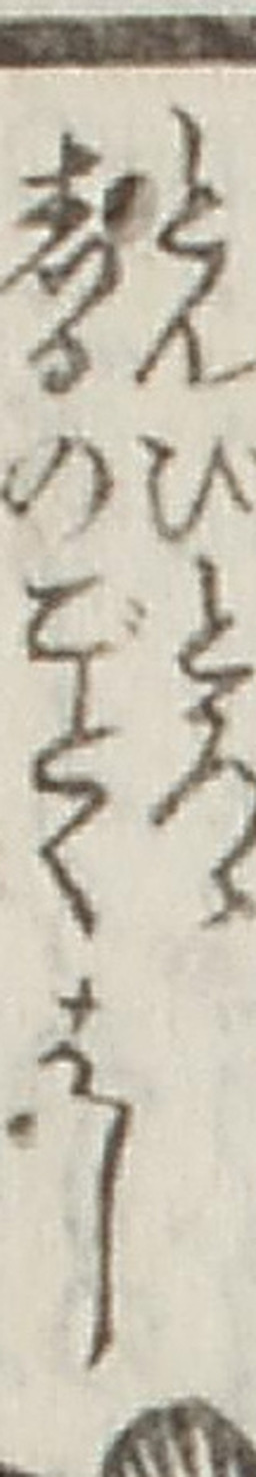しるのごとくはし
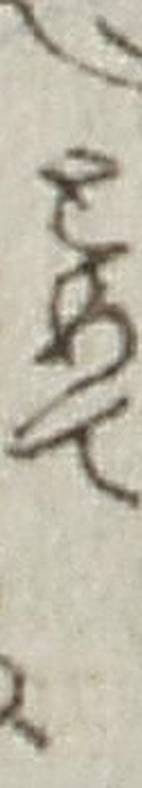とめて
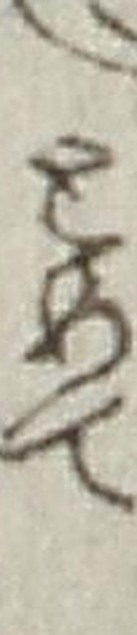とめて
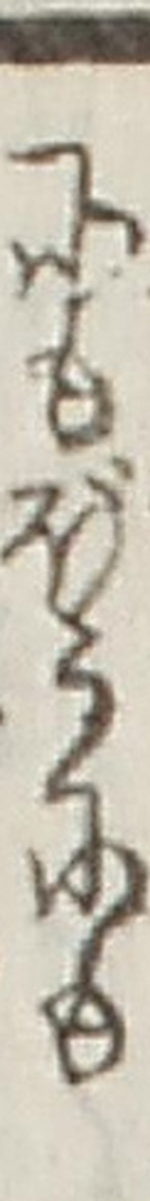にもぼうにも
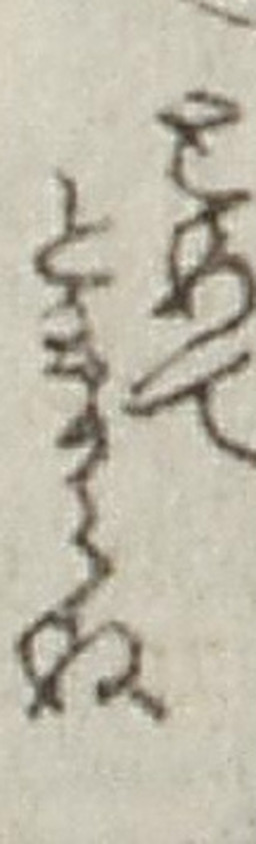とまらぬ
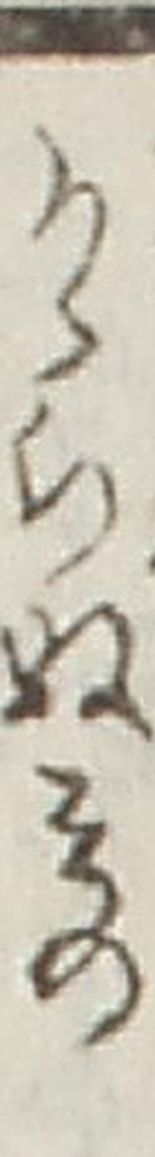かゝらぬみの
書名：三世相出雲當座帳　上下冊
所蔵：東京大学地震研究所図書室 Earthquake Research Institute Library, The University of Tokyo, JAPAN
